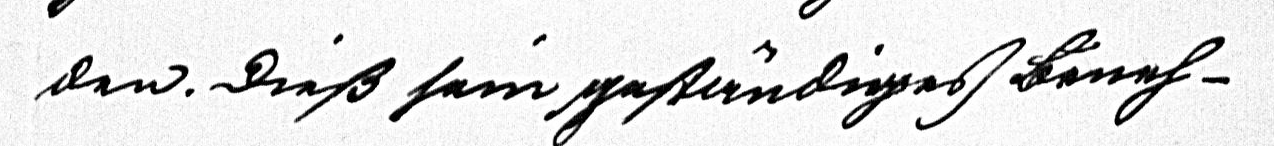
den. Dieß sein geständiges Beneh¬
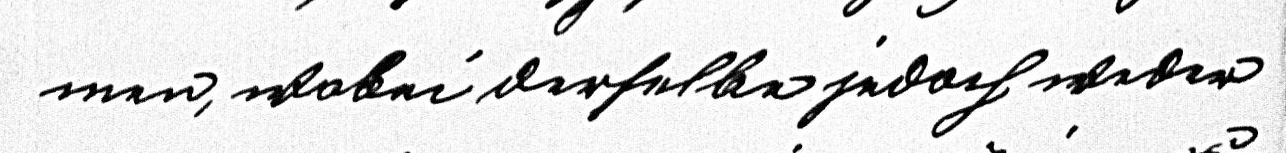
men, wobei derselbe jedoch weder
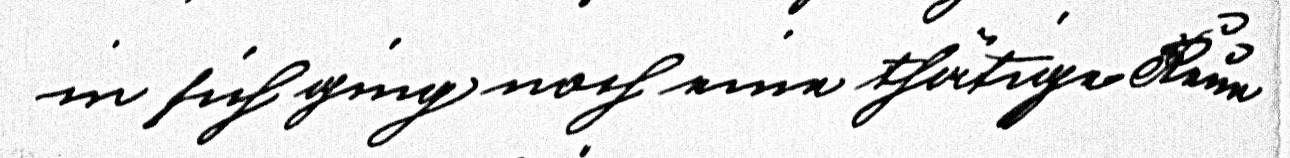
in sich ging noch eine thätige Reue¬
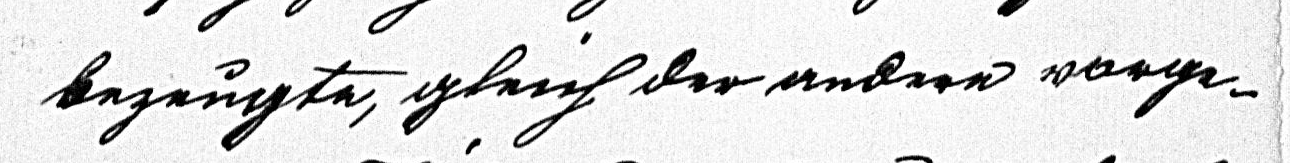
bezeugte, gleich der andere vorge¬
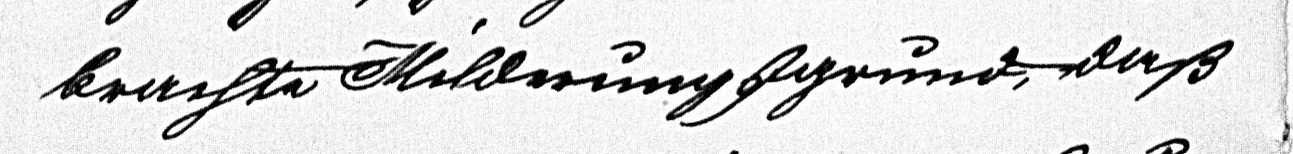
brachte Milderung Igrund, daß
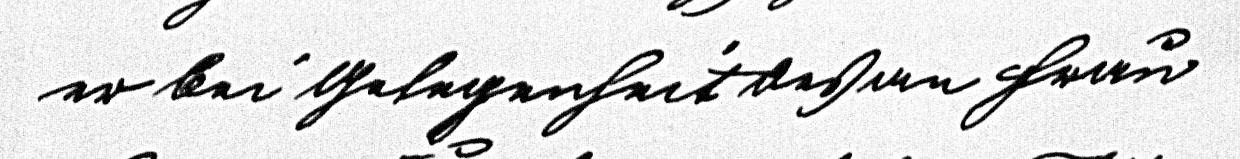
er bei Gelegenheit des an Frau
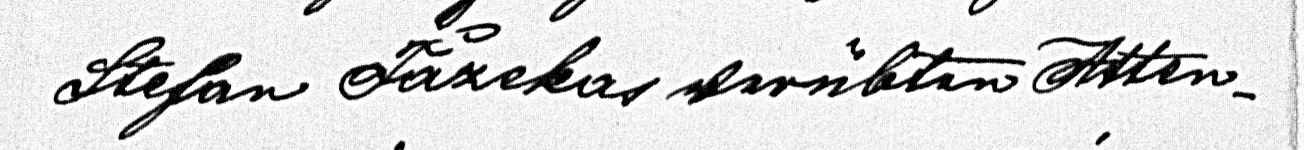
Stefan Fazekas verübten Atten¬
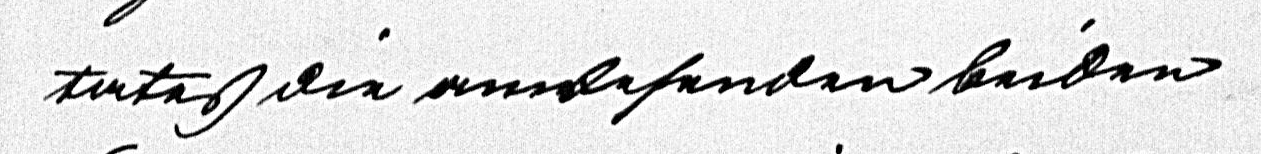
tates die anwesenden beiden
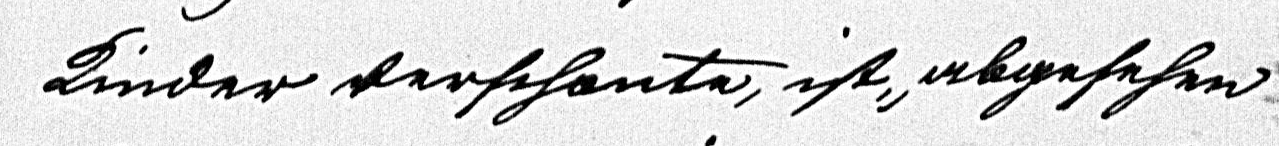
Kinder verschonte, ist, abgesehen
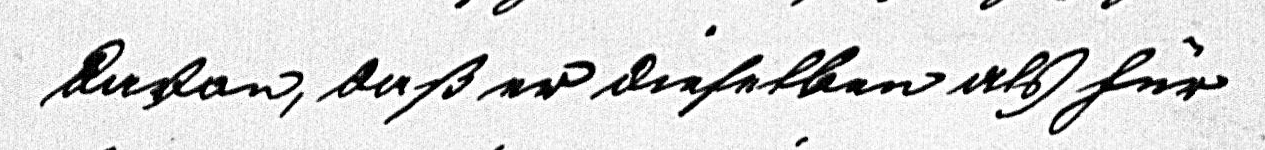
davon, daß er dieselben als für
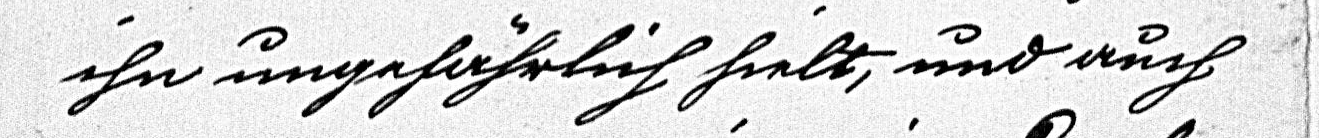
ihn ungefährlich hielt, und auch
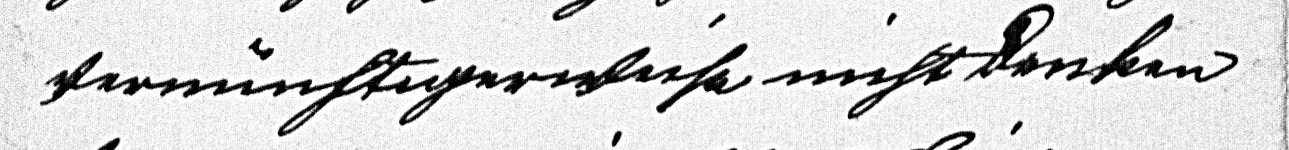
vernünftigerweise nicht denken
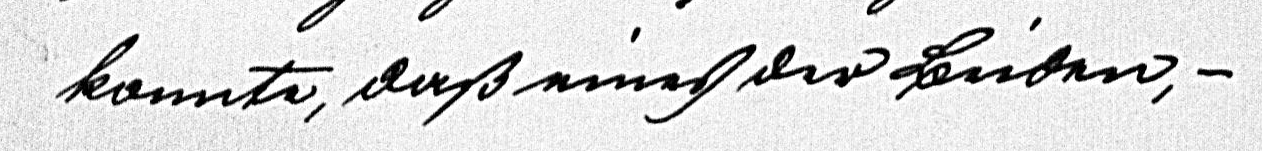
konnte, daß eines der Beiden, -
